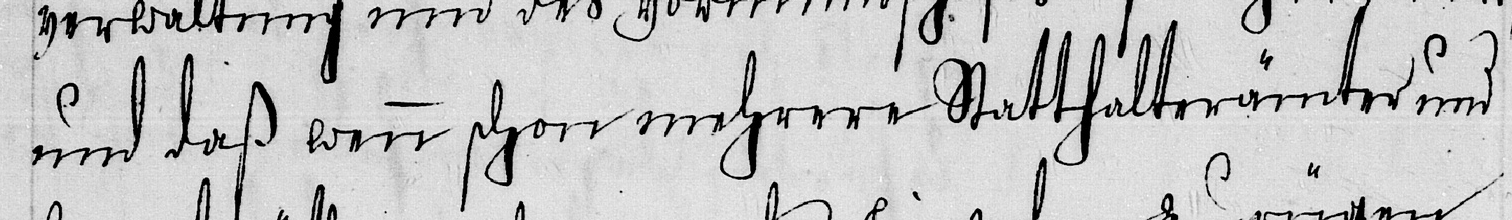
und daß wenn schon mehrere Statthalterämter und
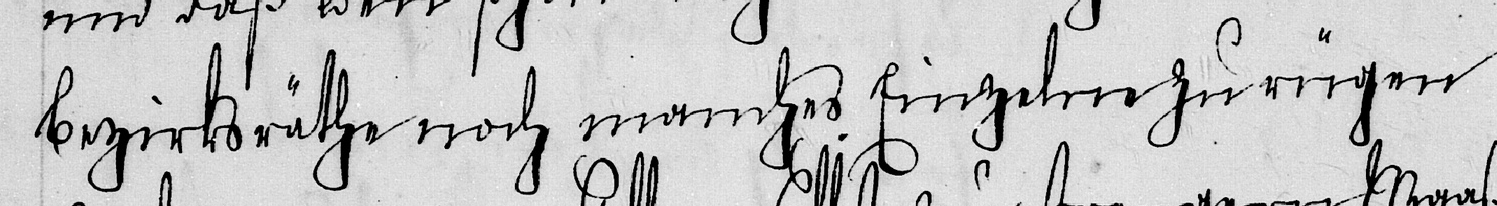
Bezirksräthe noch manches Einzelne zu rügen
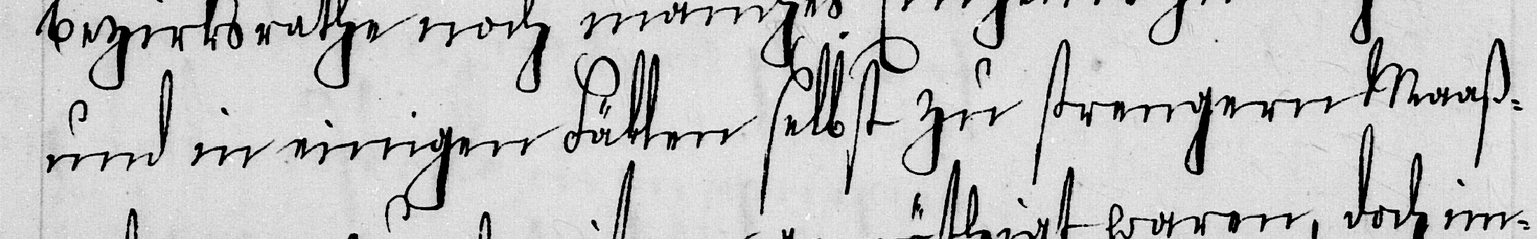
und in einigen Fällen selbst zu strengern Maaß¬
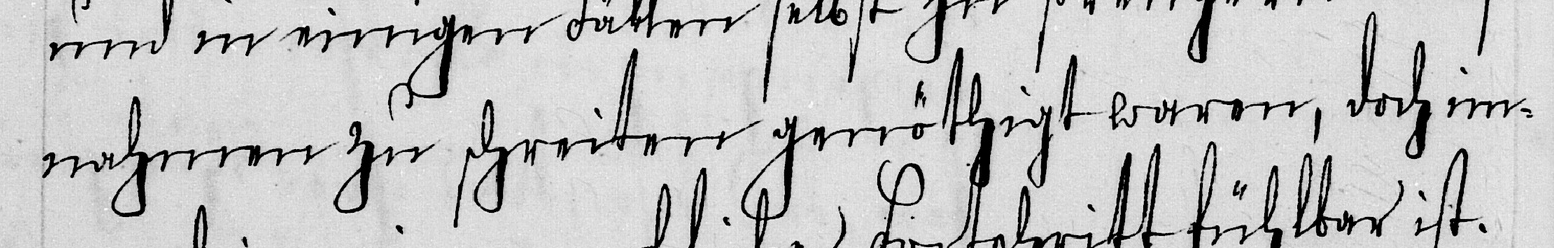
nahmen zu schreiten genöthigt waren, doch im¬
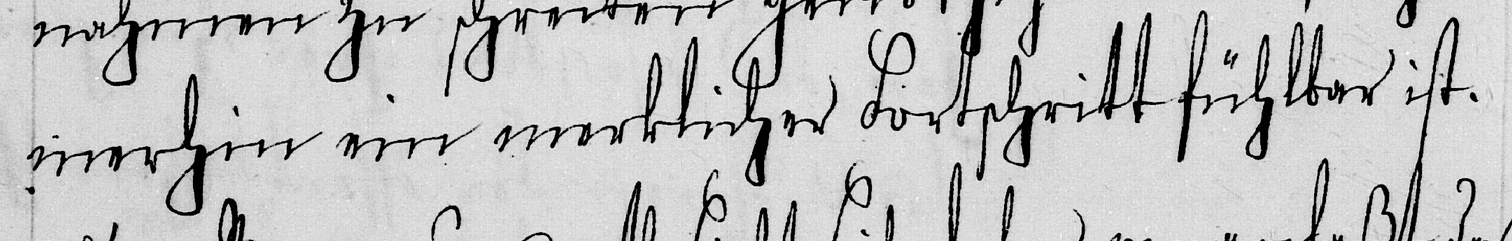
merhin ein merklicher Fortschritt fühlbar ist.
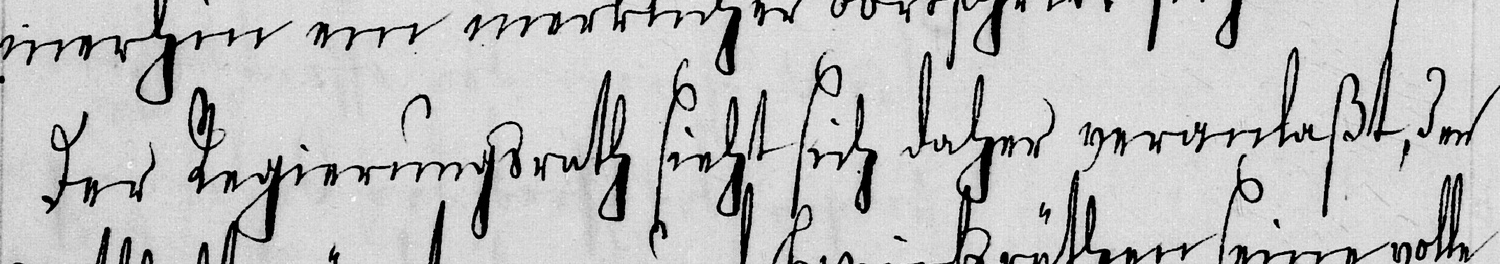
Der Regierungsrath sieht sich daher veranlaßt, den
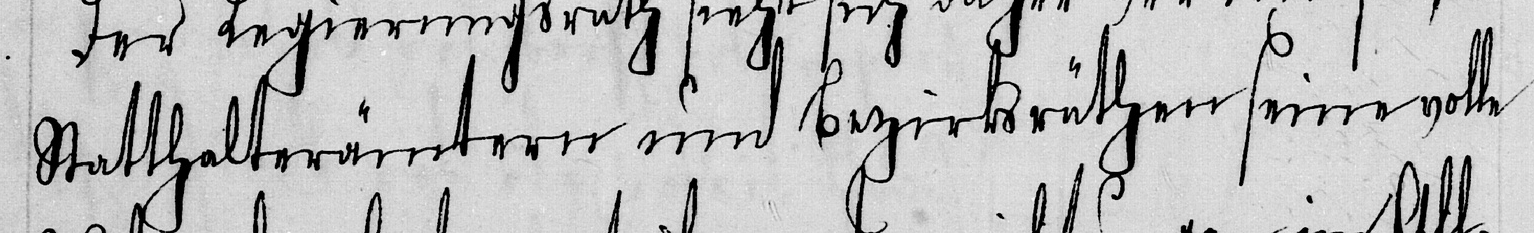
Statthalterämtern und Bezirksräthen seine volle
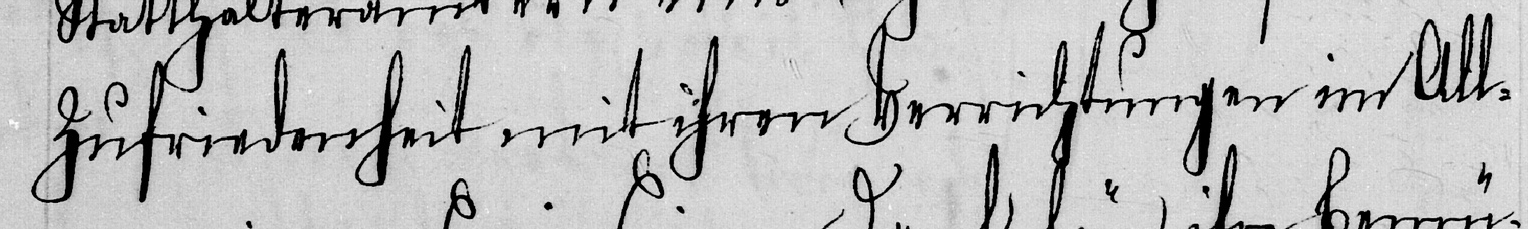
Zufriedenheit mit ihren Verrichtungen im All¬
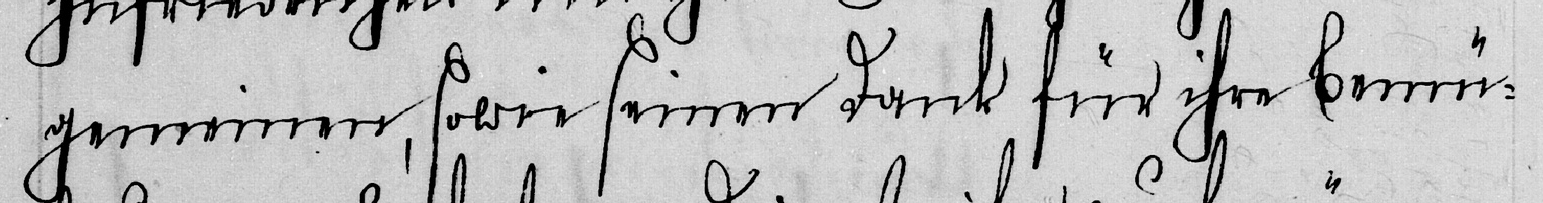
gemeinen, sowie seinen Dank für ihre Bemü¬
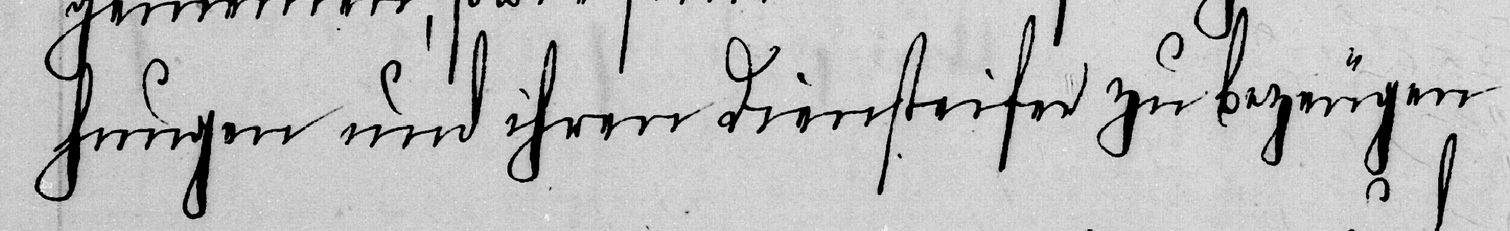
hungen und ihren Diensteifer zu bezeugen
